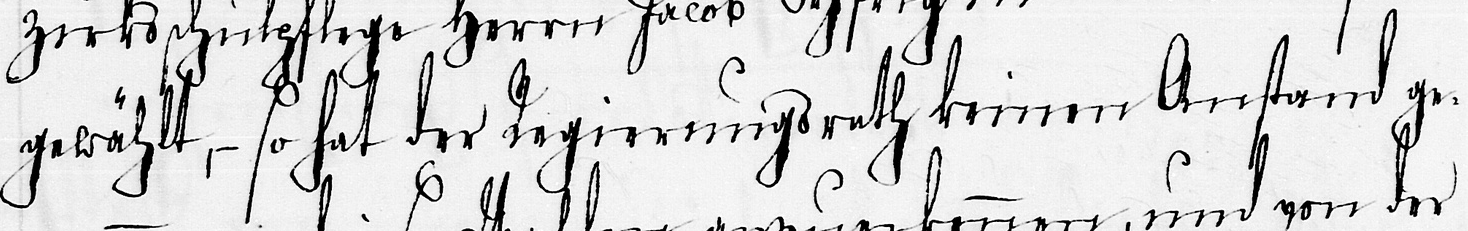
gewählt, – so hat der Regierungsrath keinen Anstand ge¬
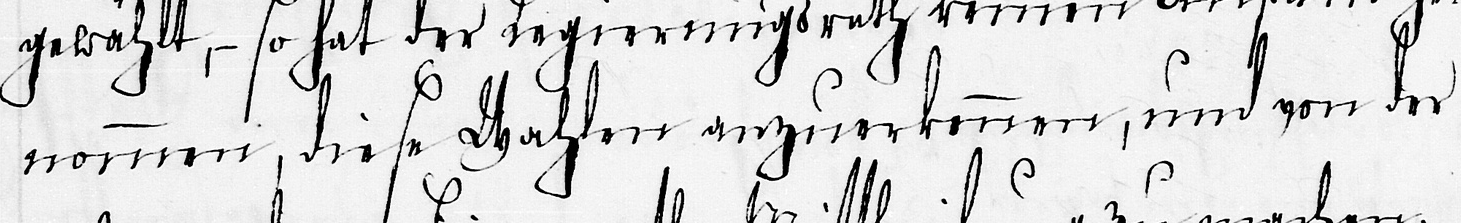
nommen, diese Wahlen anzuerkennen, und von der
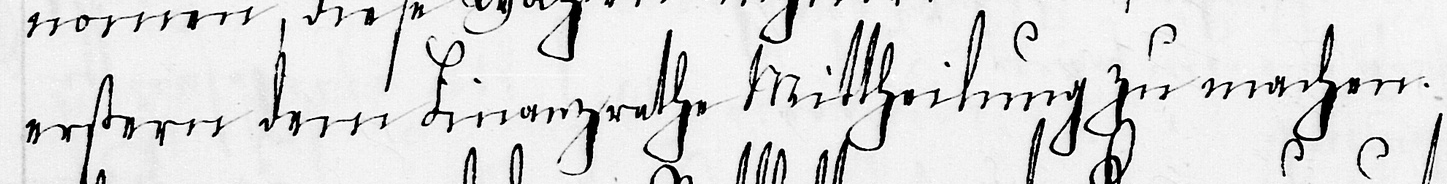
erstern dem Finanzrathe Mittheilung zu machen.
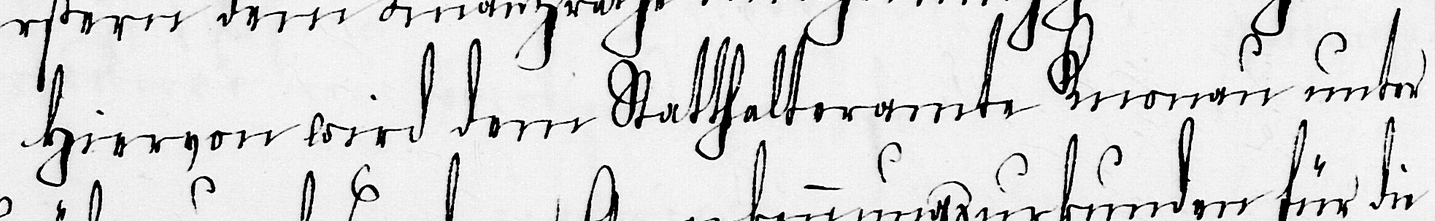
Hiervon wird dem Statthalteramte Knonau unter
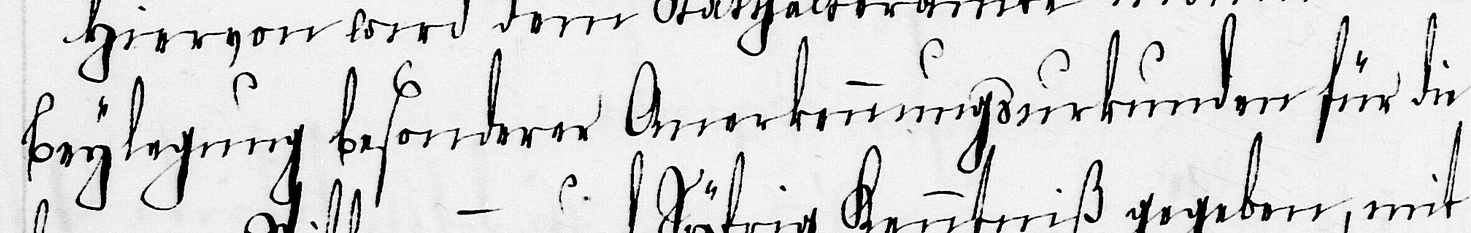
Beylegung besonderer Anerkennungsurkunden für die
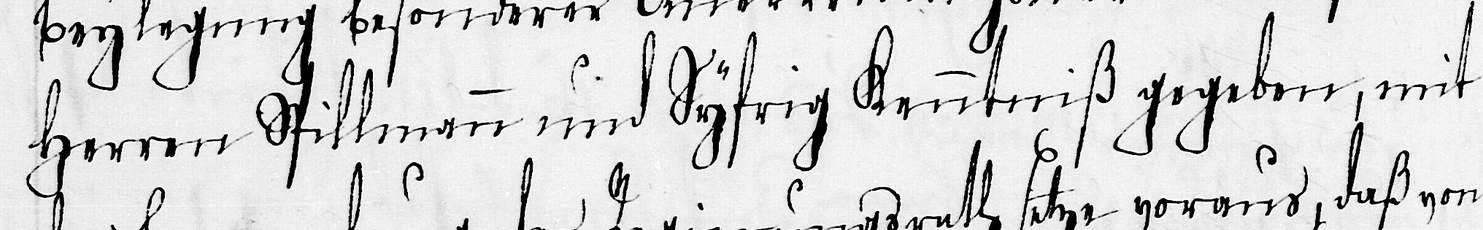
Herren Spillmann und Syfrig Kenntniß gegeben, mit
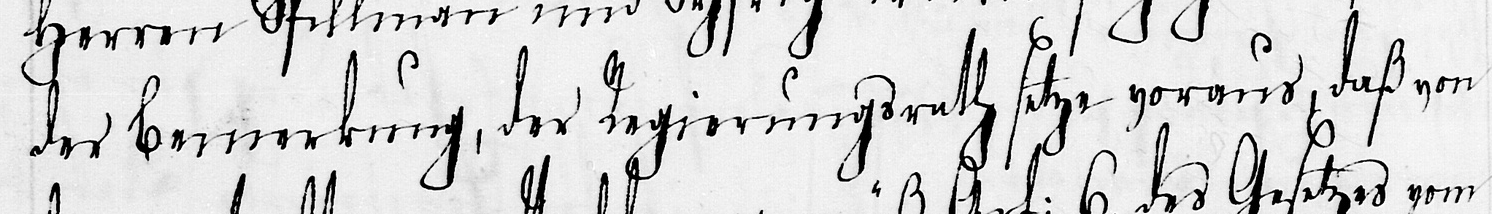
der Bemerkung, der Regierungsrath setze voraus, daß von
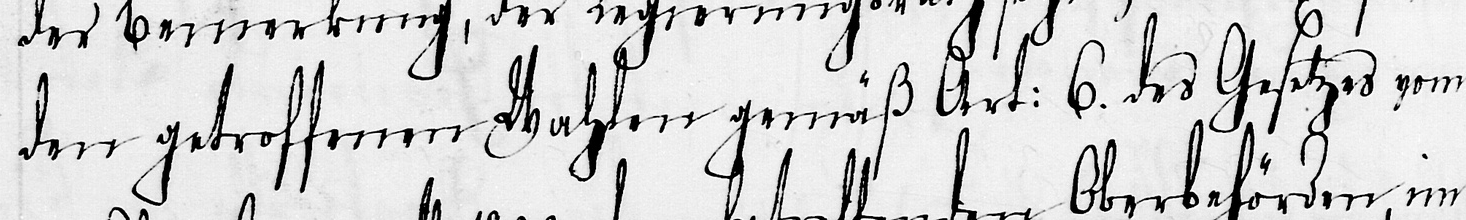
den getroffenen Wahlen gemäß Art: 6. des Gesetzes vom
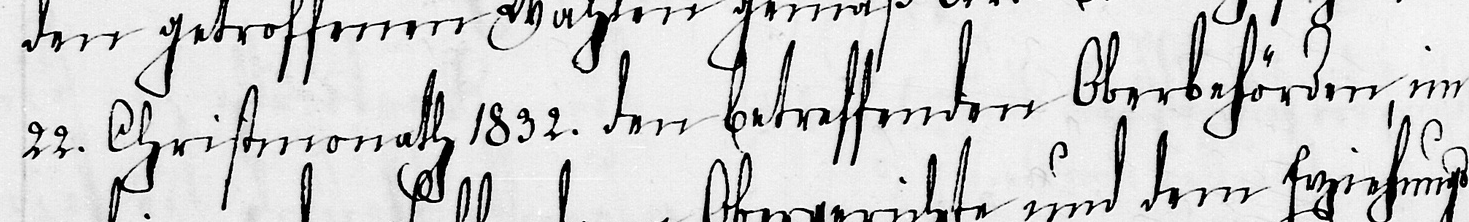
22. Christmonath 1832. den betreffenden Oberbehörden, im
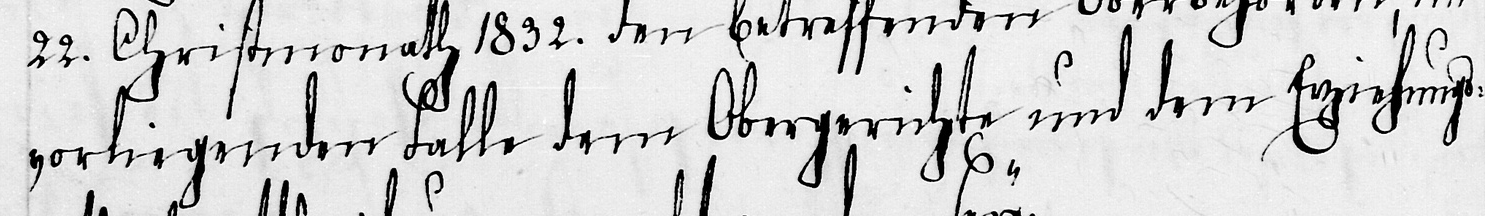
vorliegenden Falle dem Obergerichte und dem Erziehung¬
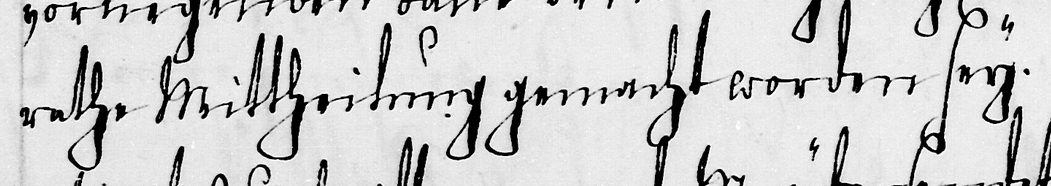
srathe Mittheilung gemacht worden sey.
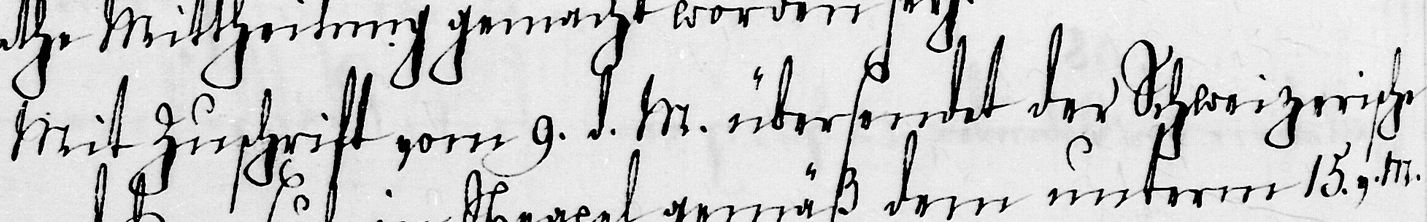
Mit Zuschrift vom 9. d. M. übersendet der Schweizerisc¬
